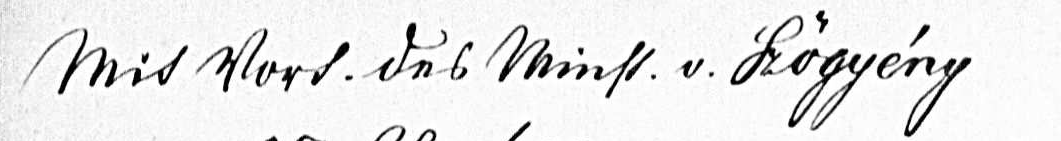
Mit Vort. des Minist. v. Szögyény
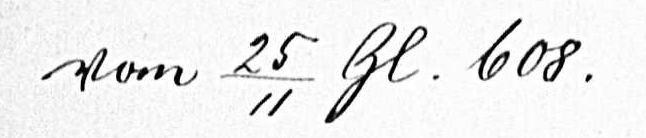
Vom 25/11 Zl. 608
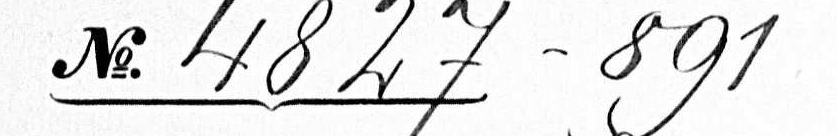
No. 4827 – 1891
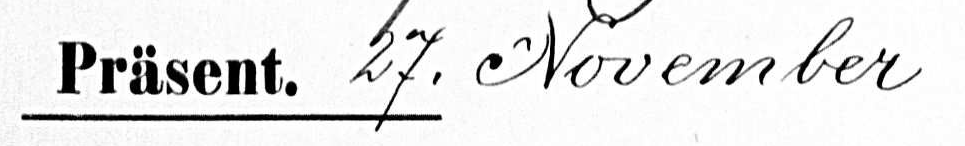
Präsent. 27. November
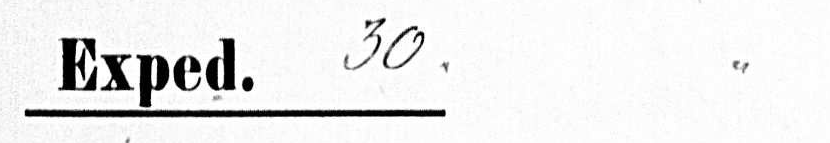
Expedit 30. „
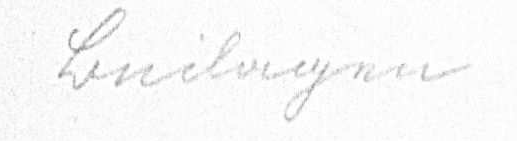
Beilagen
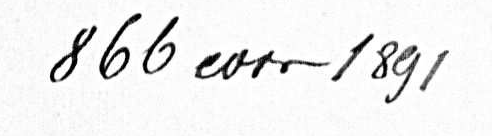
866 corr 1891
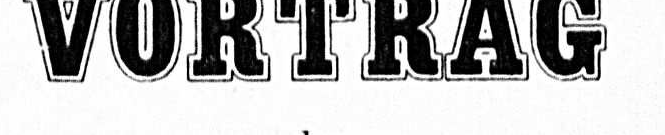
Vortrag
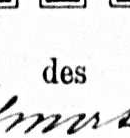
des
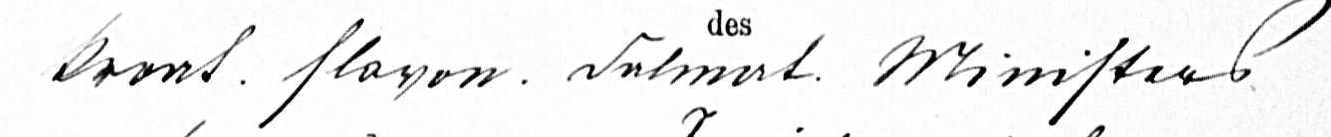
kroat. slavon. delmat. Ministers
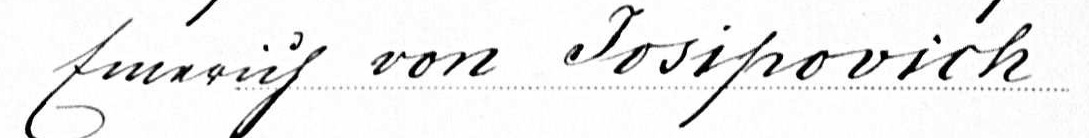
Emerich von Josipovich
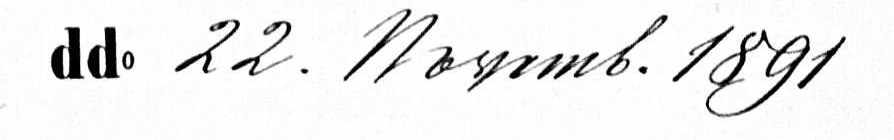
Ddo 22. Novemb. 1891
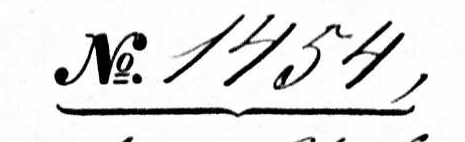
No 1454
